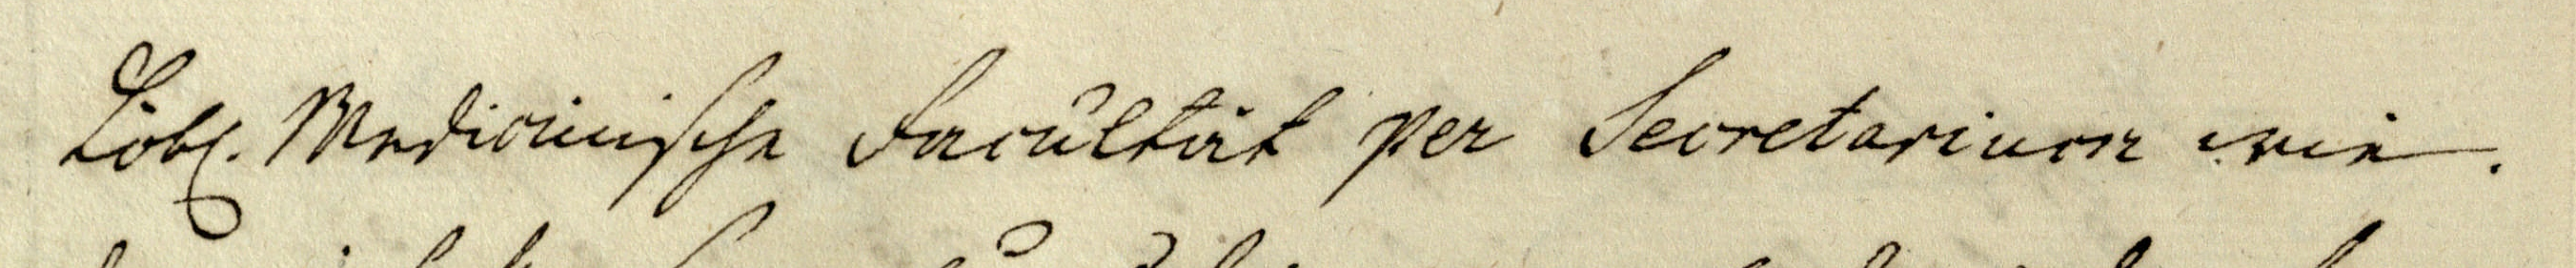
Löbl. Medicinische Facultät per Secretarium wie¬
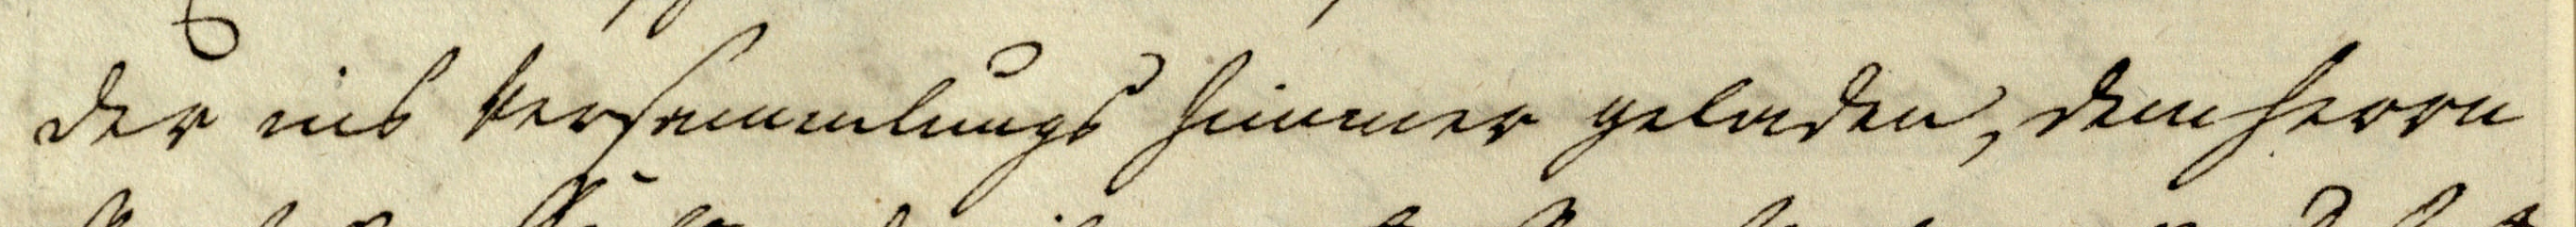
der ins Versammlungs Zimmer geladen, dem Herrn
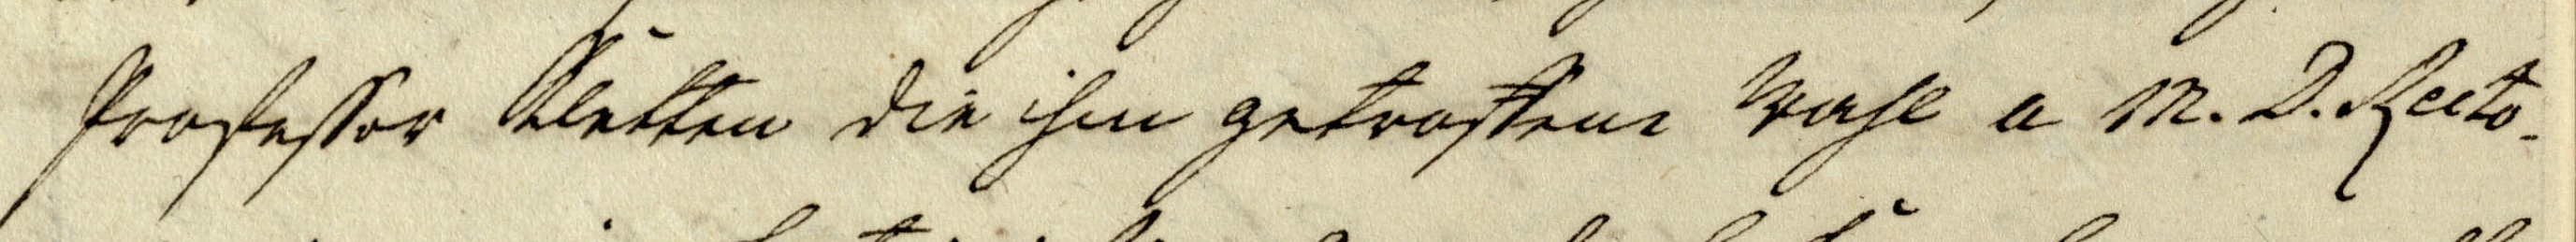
Professor Kletten die ihm getroffene Wahl a M. D. Recto¬
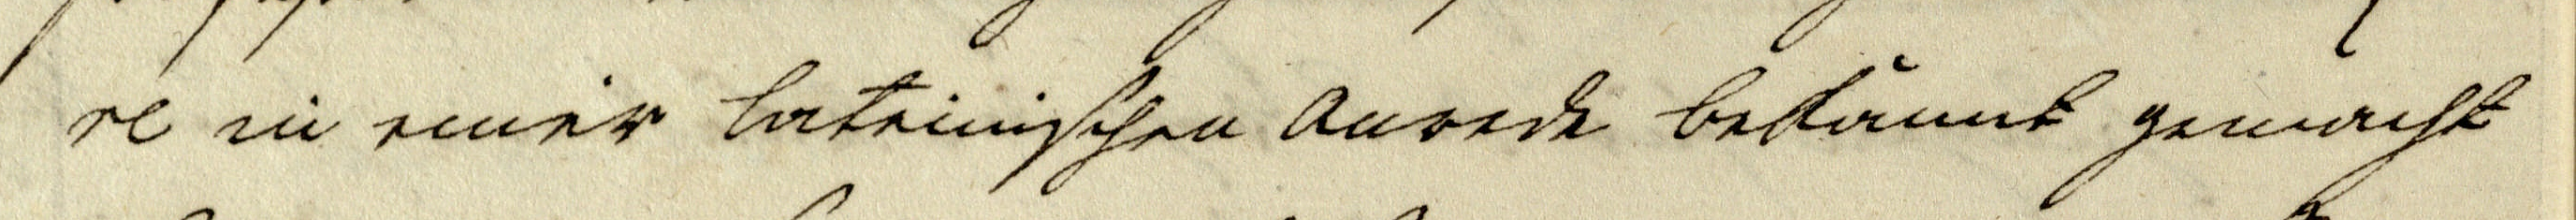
re in einer lateinischen Anrede bekannt gemacht
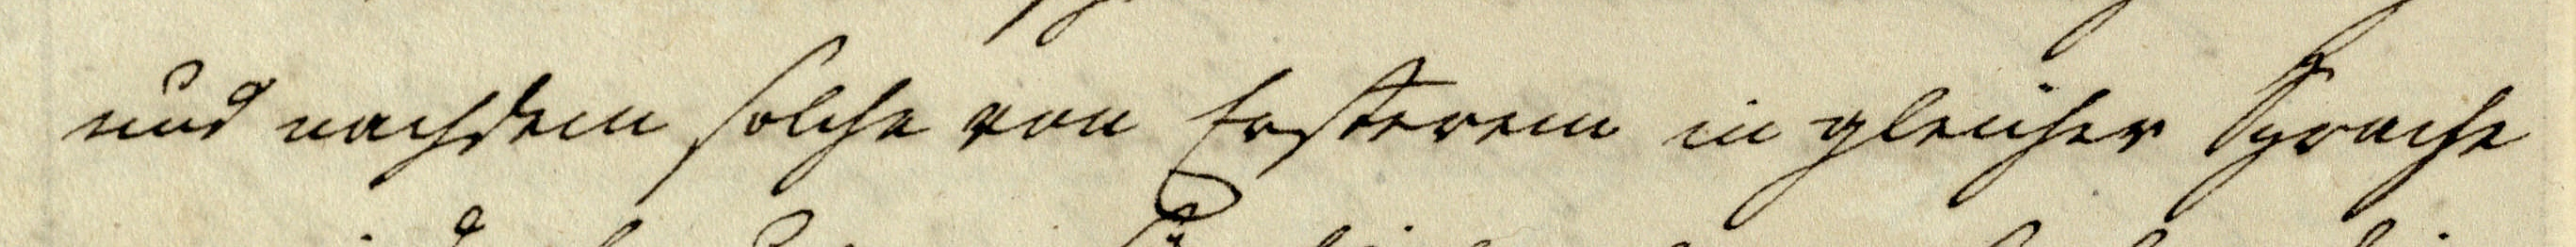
und nachdem solche von Ersterem in gleicher Sprache
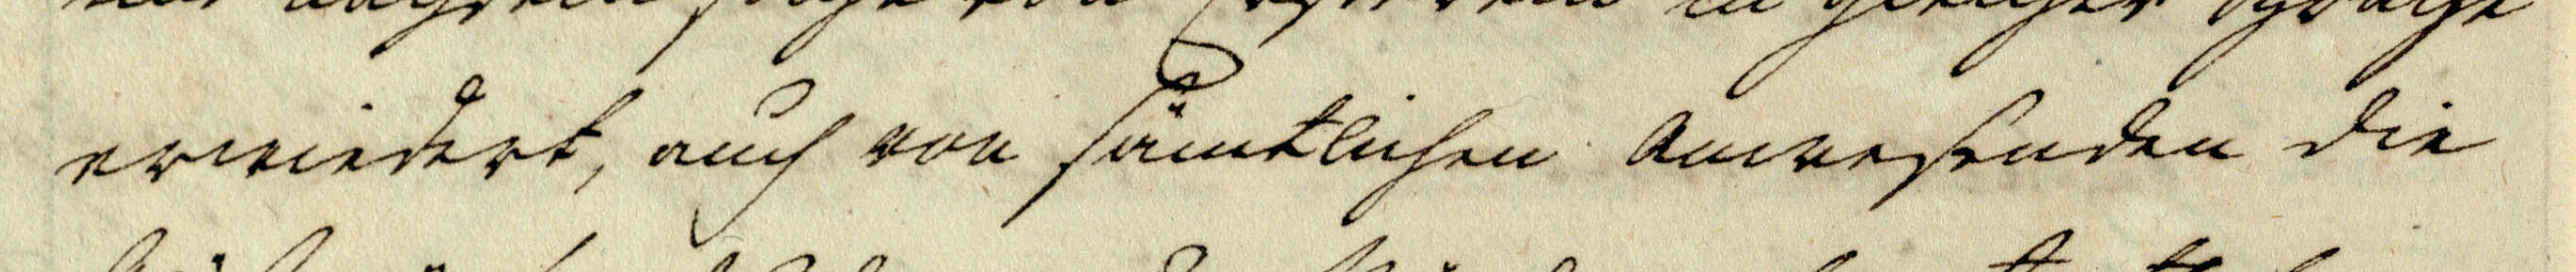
erwiedert, auch von sämtlichen Anwesenden die
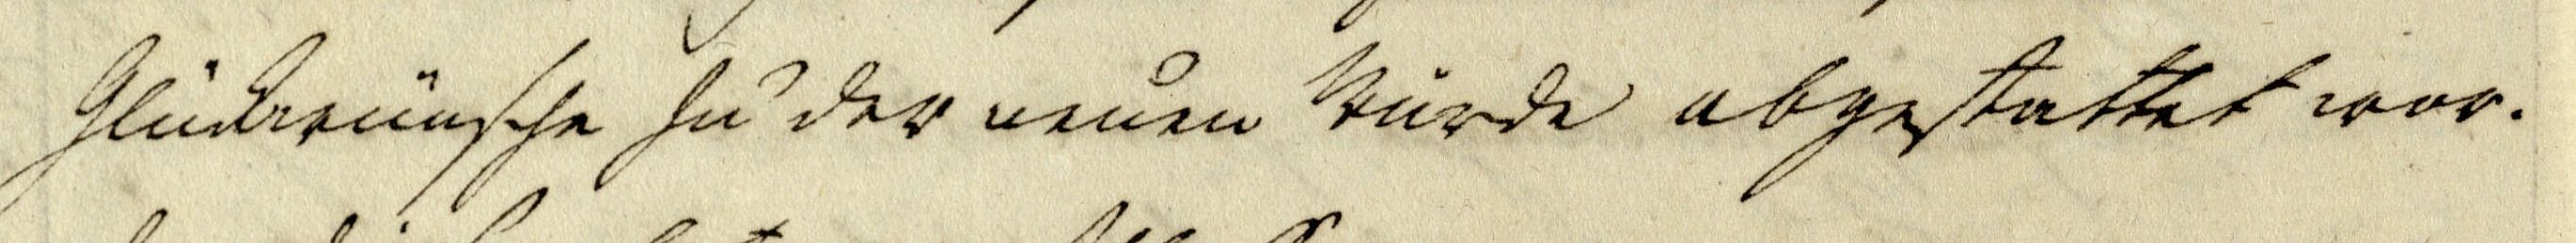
Glückwünsche zu der neuen Würde abgestattet wor¬
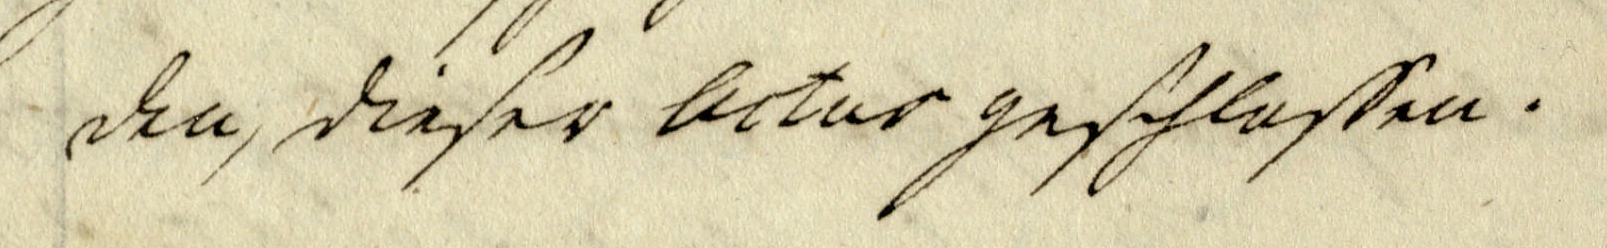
den, dieser Actus geschlossen.
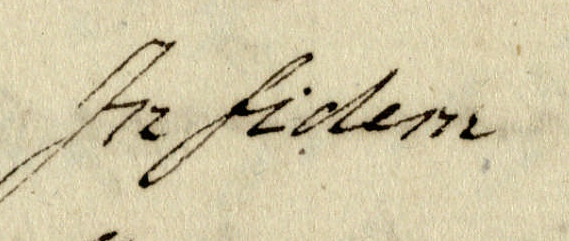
In fidem
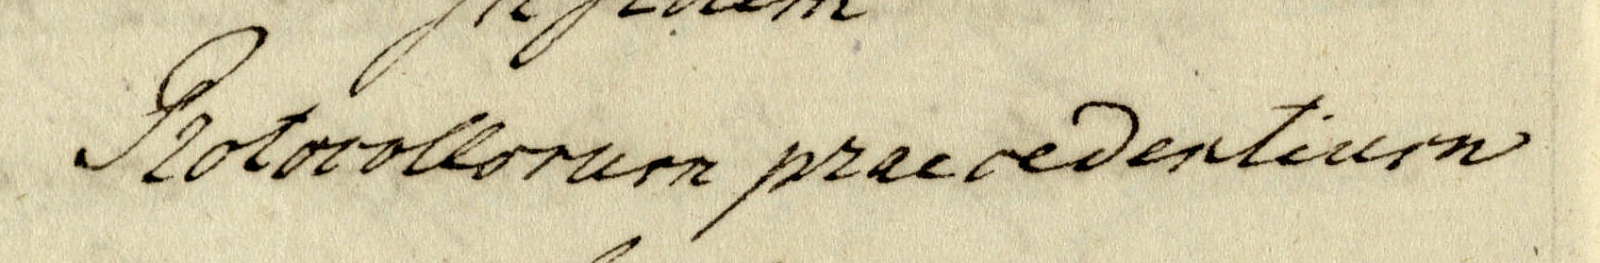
Protocollorum praecedentium
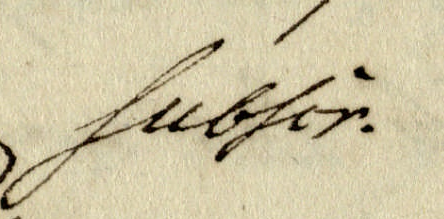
subscr.
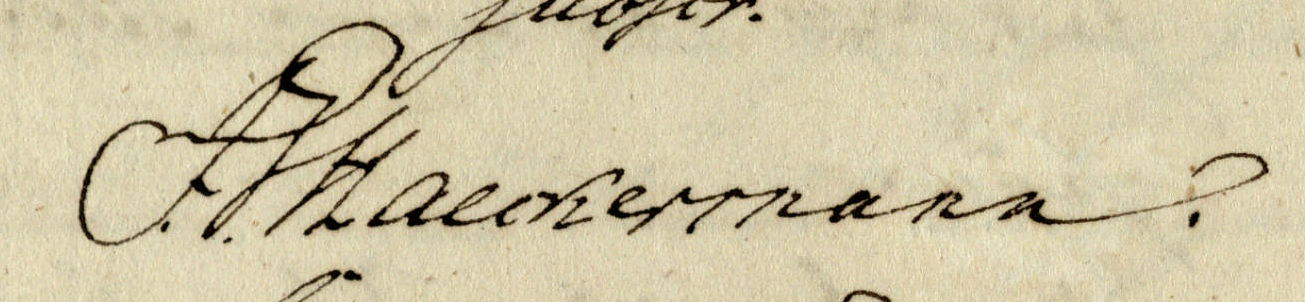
J. G.Haeckermann
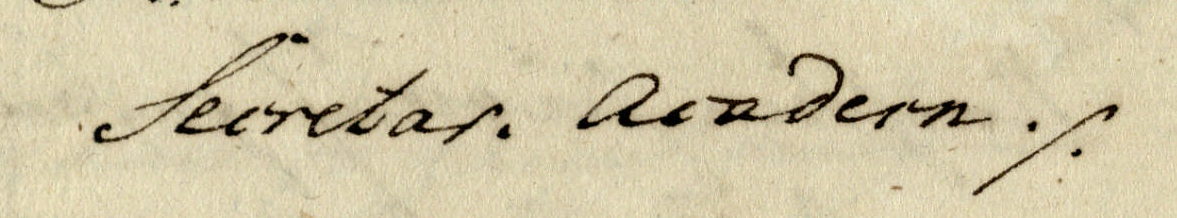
Secretar. Academ.
